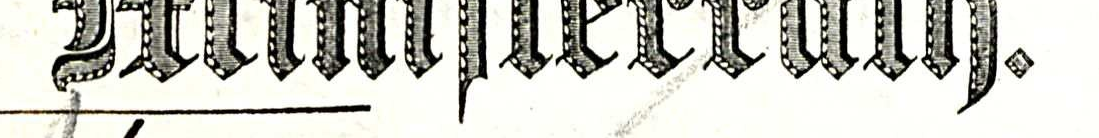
Ministerrath.
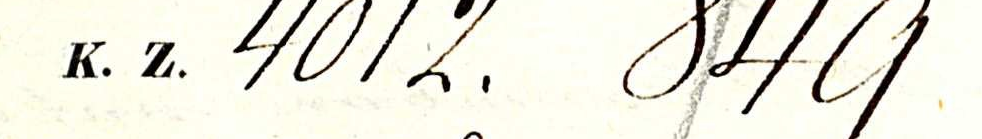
K. Z. 4012. 849
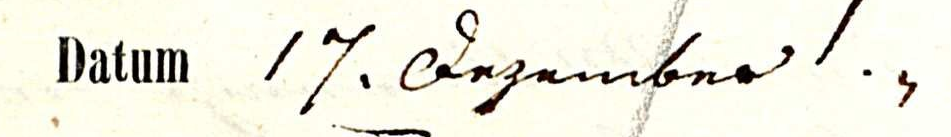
Datum 17. Dezember 849
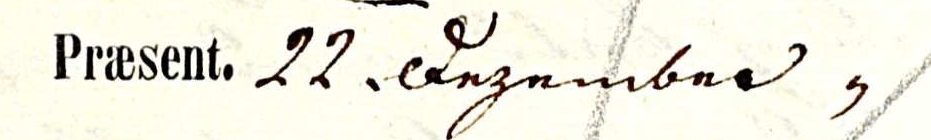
Præsent. 22. Dezember 849
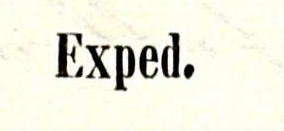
Exped.
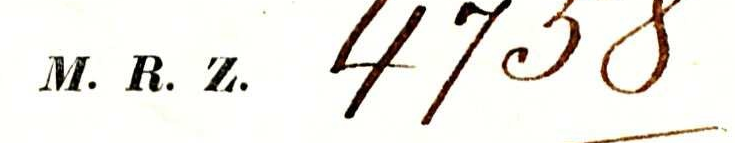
M. R. Z. 4758
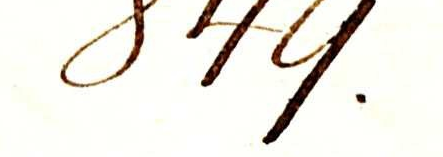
849
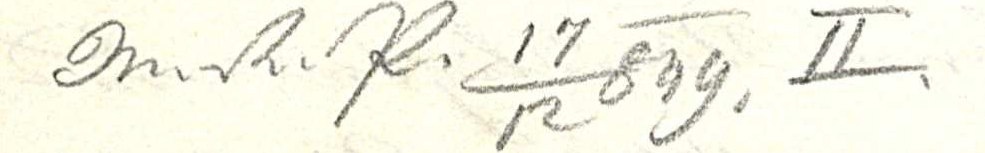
M. R. P. 17/12 849. II.
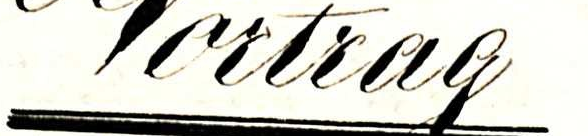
Vortrag
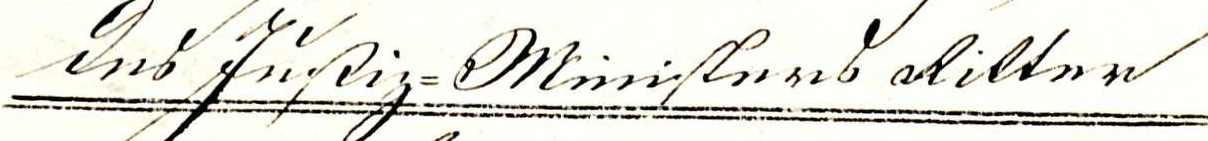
des Justiz=Ministers Ritter
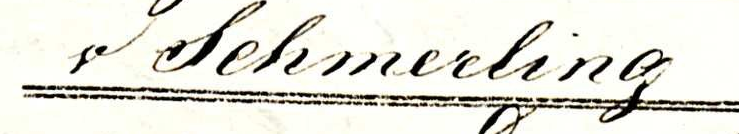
v Schmerling
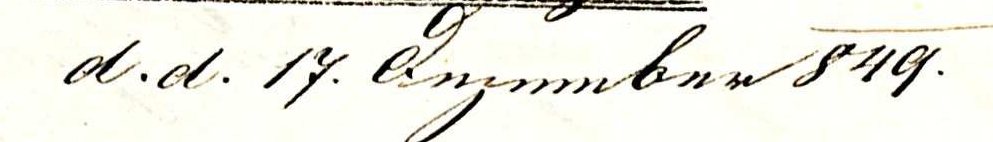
d. d. 1w7. Dezember 849.
